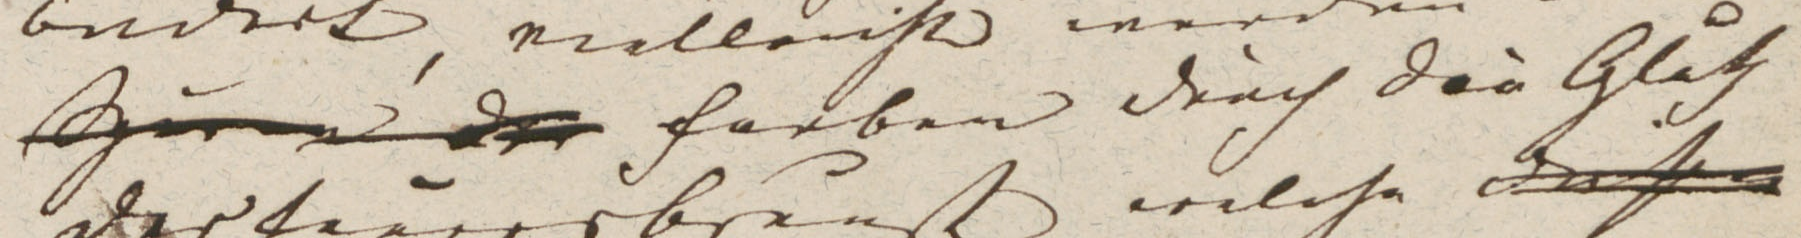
Spuren der Farben durch die Gluth
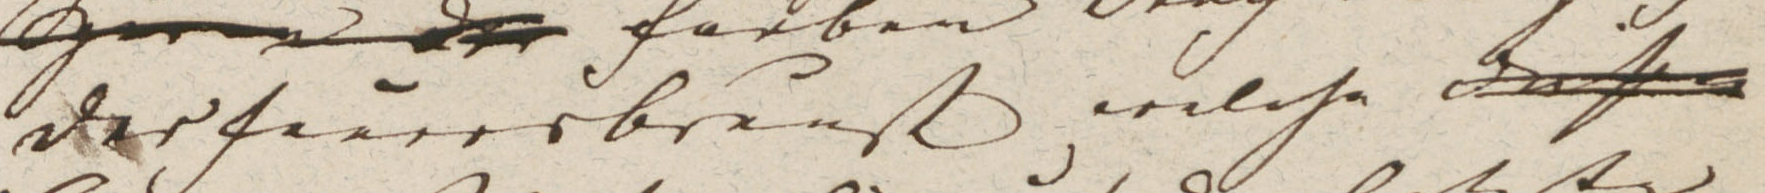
der Feuersbrunst welche diesen
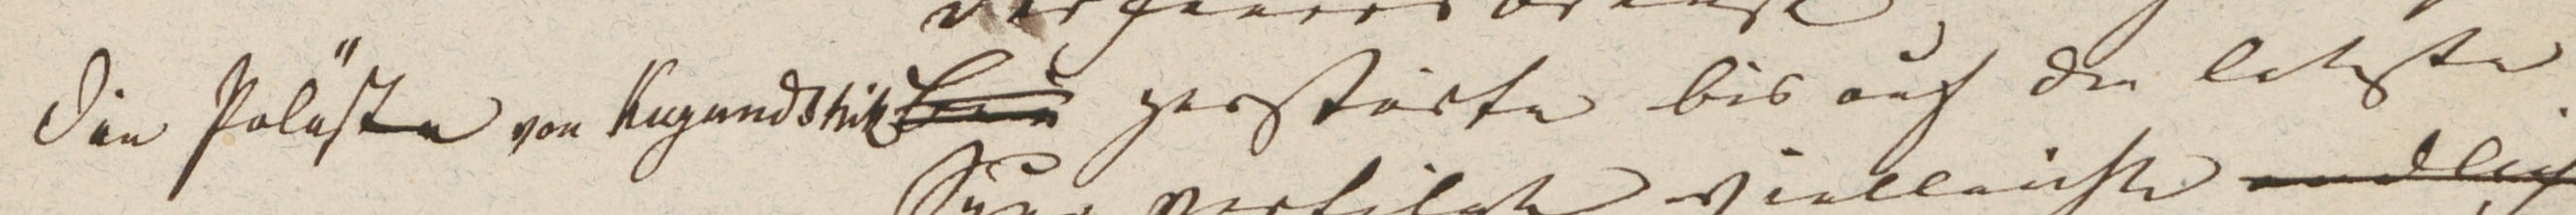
die Paläste von Kuundshik Bau zerstörte bis auf die letzte
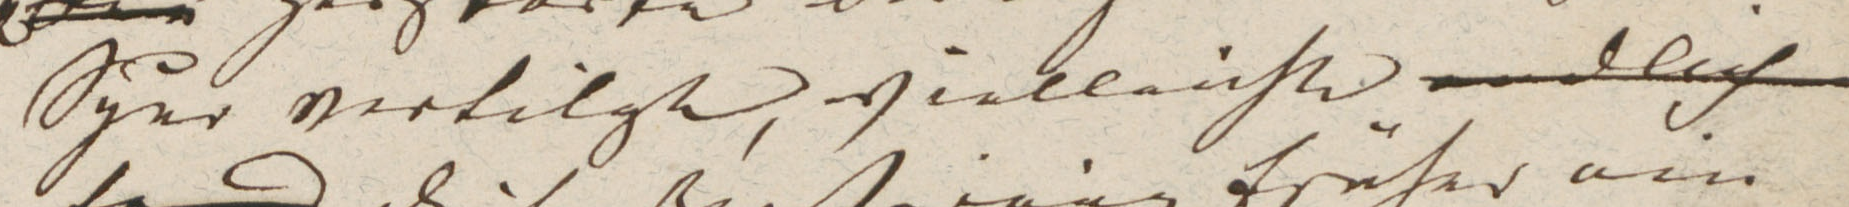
Spur vertilgt, vielleicht endlich
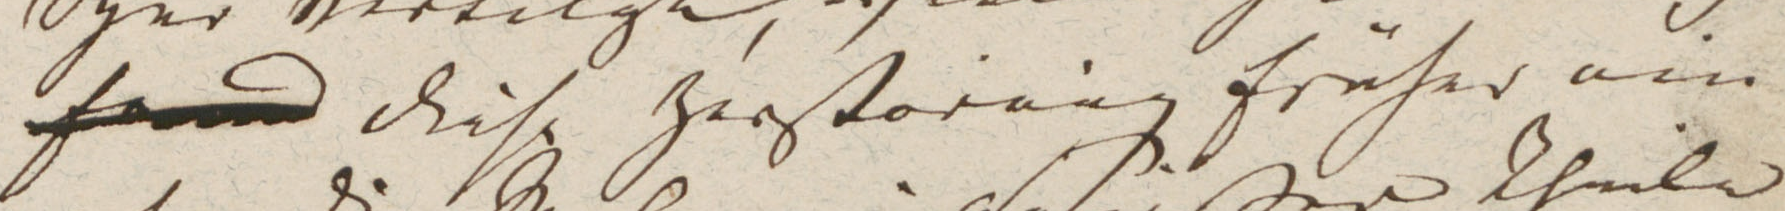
trat fand diese Zerstörung früher ein
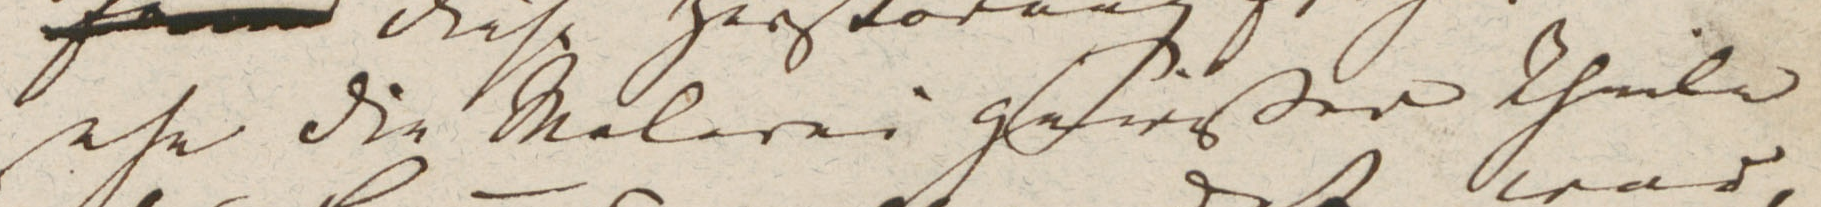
ehe die Malerei gewisser Theile
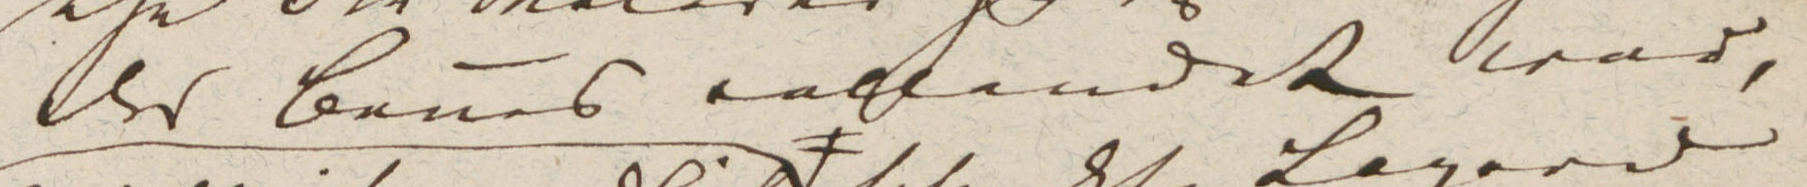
des Baues vollendet war,
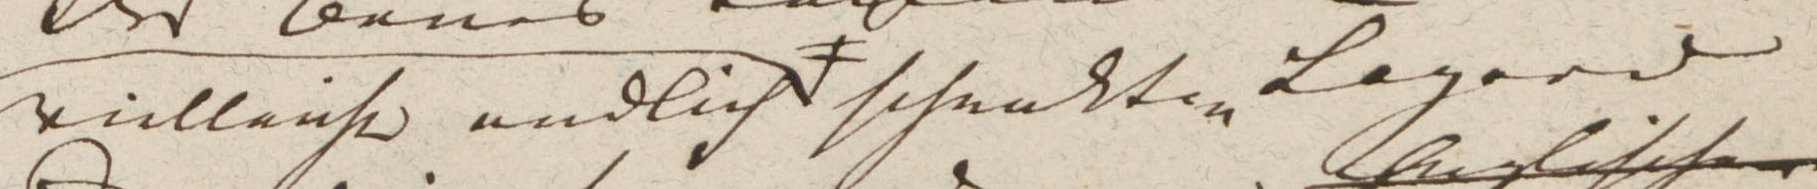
vielleicht endlich %% schenkten Layard
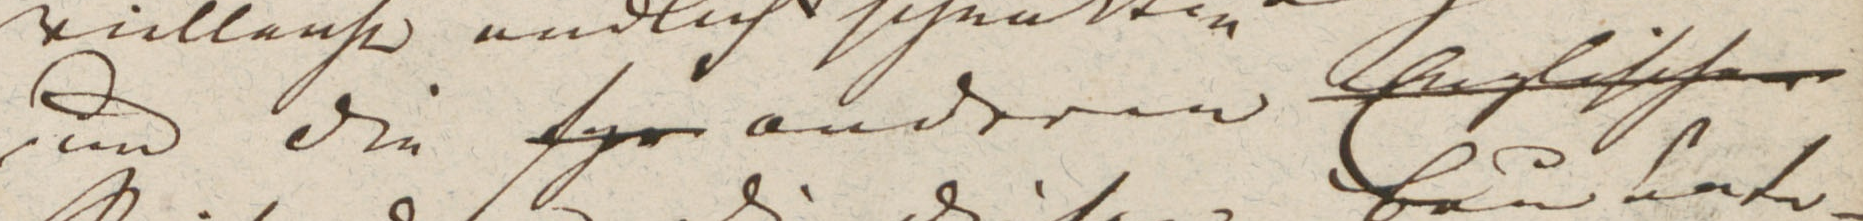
und die s anderen Englischen
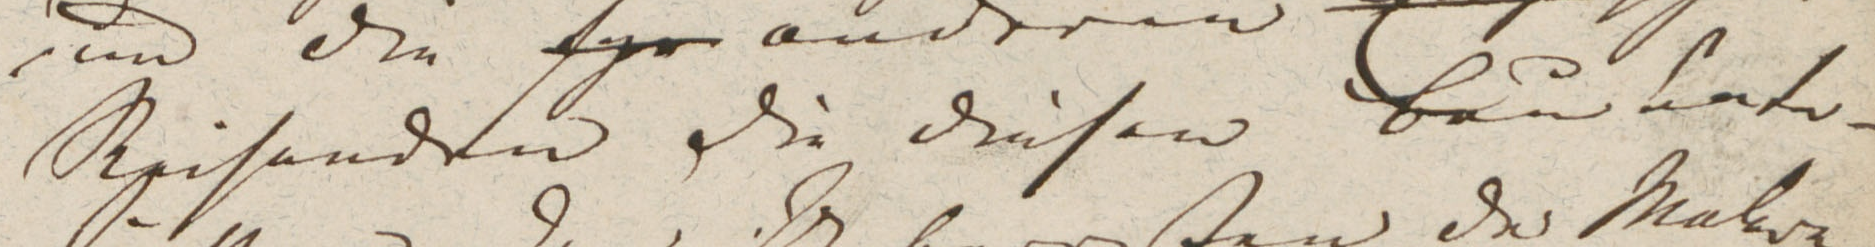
Reisenden die diesen Bau unter-
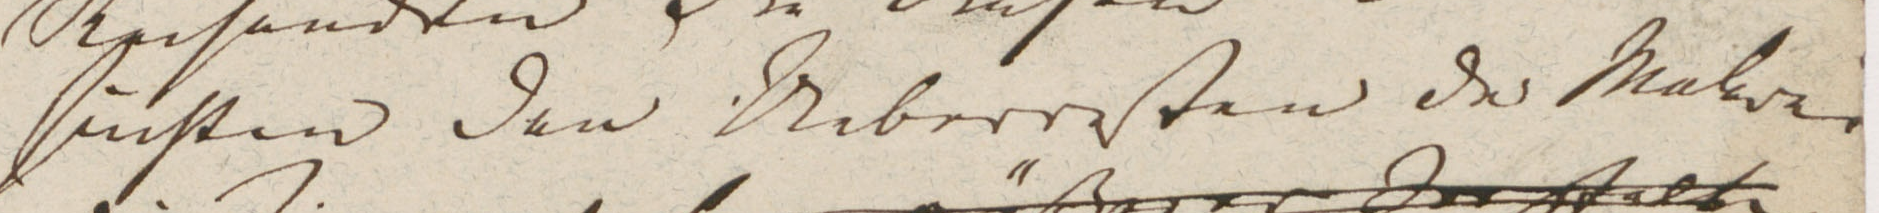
suchten den Ueberresten der Malerei
